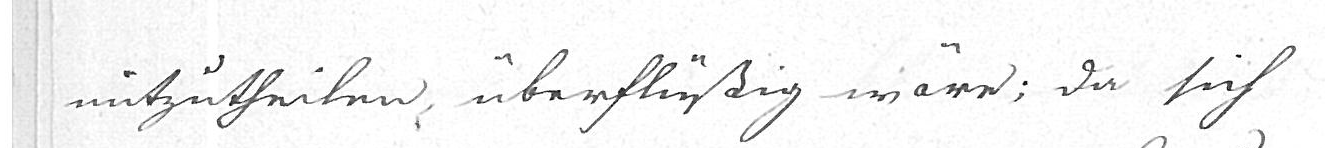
mitzutheilen, überflüßig wäre; da sich
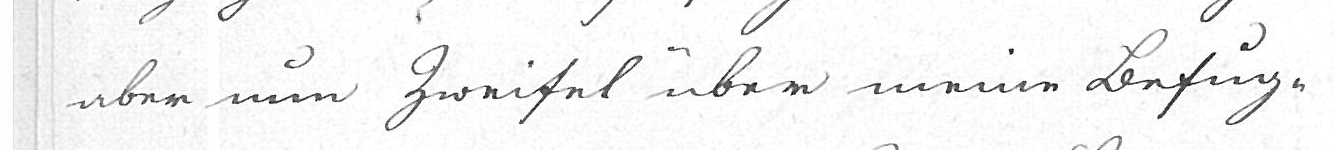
aber nun Zweifel über meine Befug-
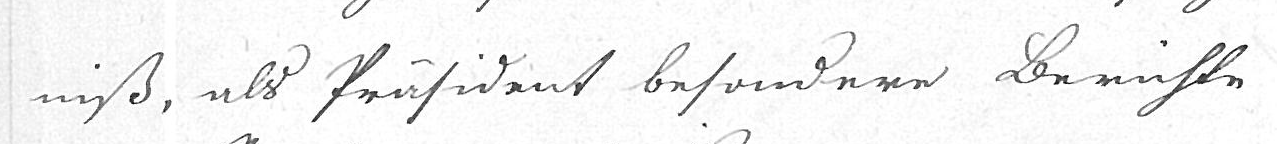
niß, als Präsident besondere Berichte
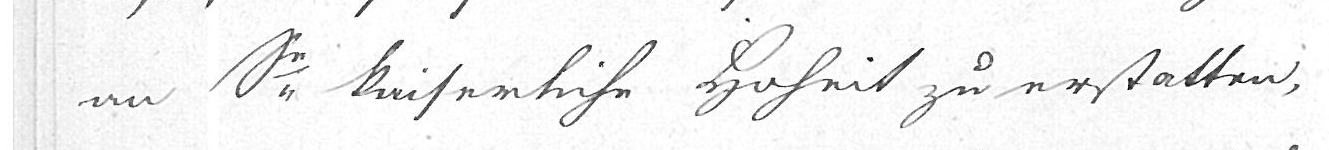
an Sr. kaiserliche Hoheit zu erstatten,
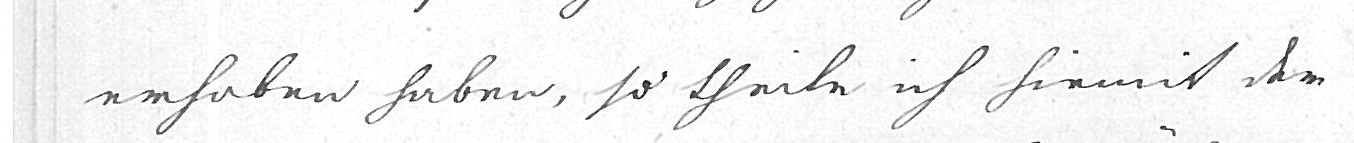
erhoben haben, so theile ich hiemit der
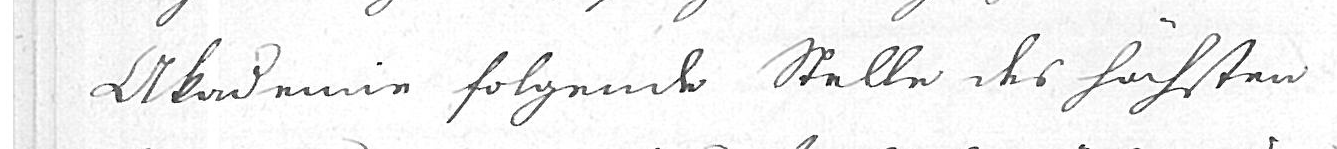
Akademie folgende Stelle des höchsten
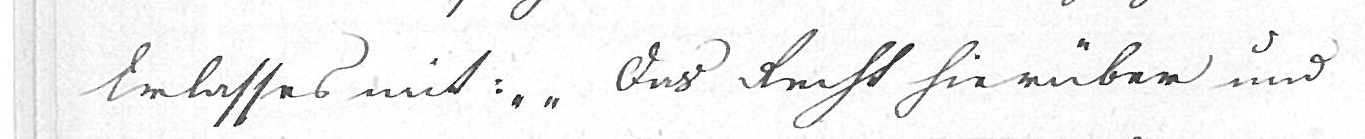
Erlasses mit: "" Das Recht hierüber und
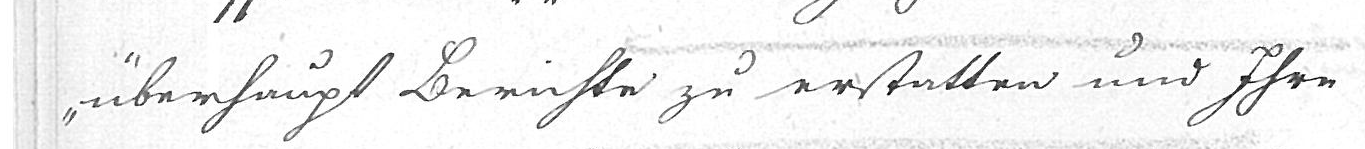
"überhaupt Berichte zu erstatten und Ihre
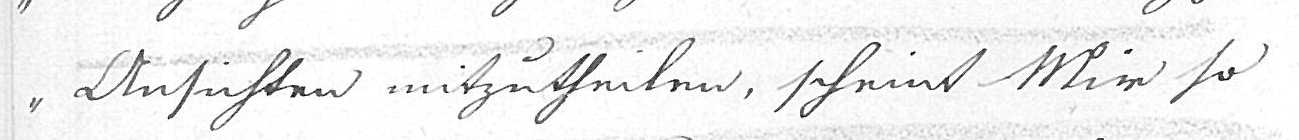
"Ansichten mitzutheilen, scheint Mir so
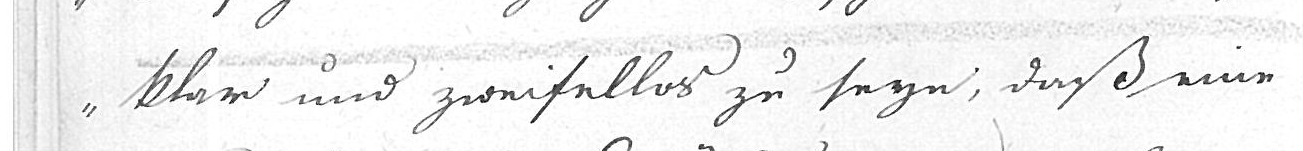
"klar und zweifellos zu seyn, daß eine
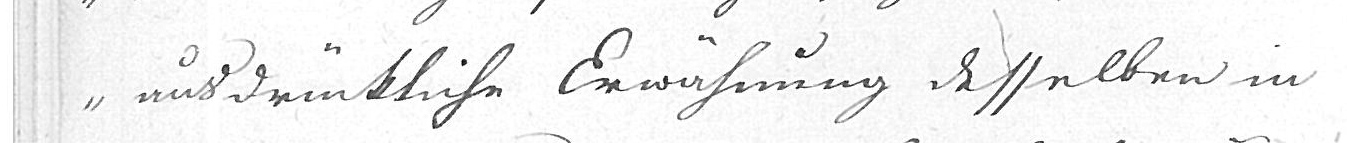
"ausdrückliche Erwähnung desselben in
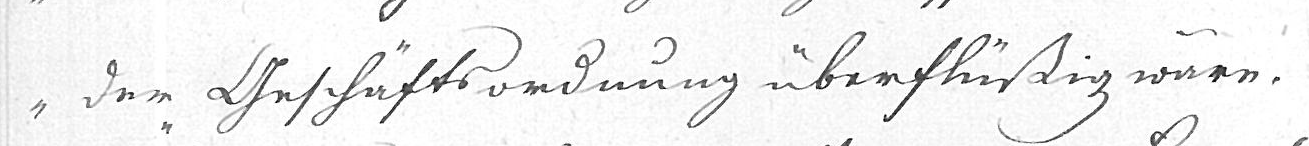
"der Geschäftsordnung überflüßit wäre.
